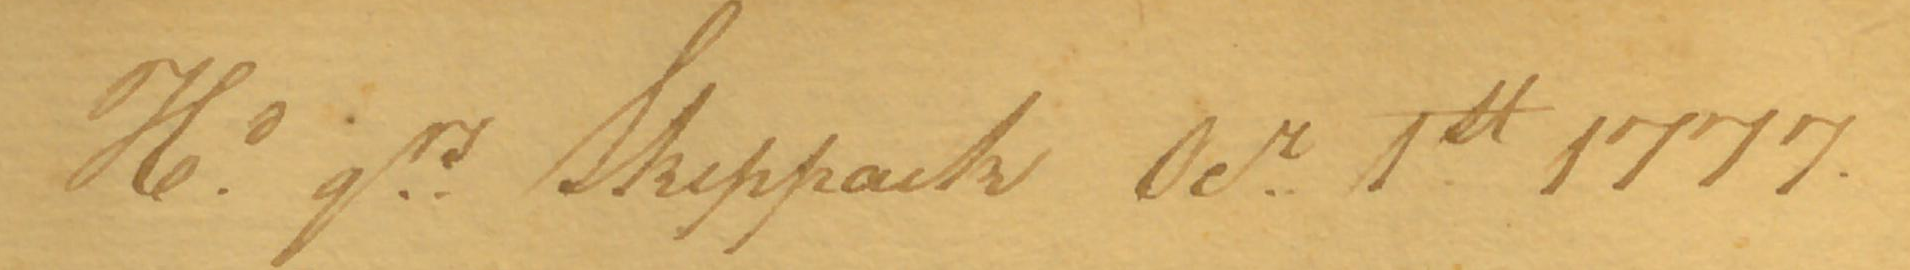H^d. q^rs. Skippack Oc^r. 1^st 1777.
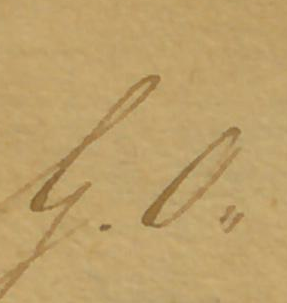G.O.
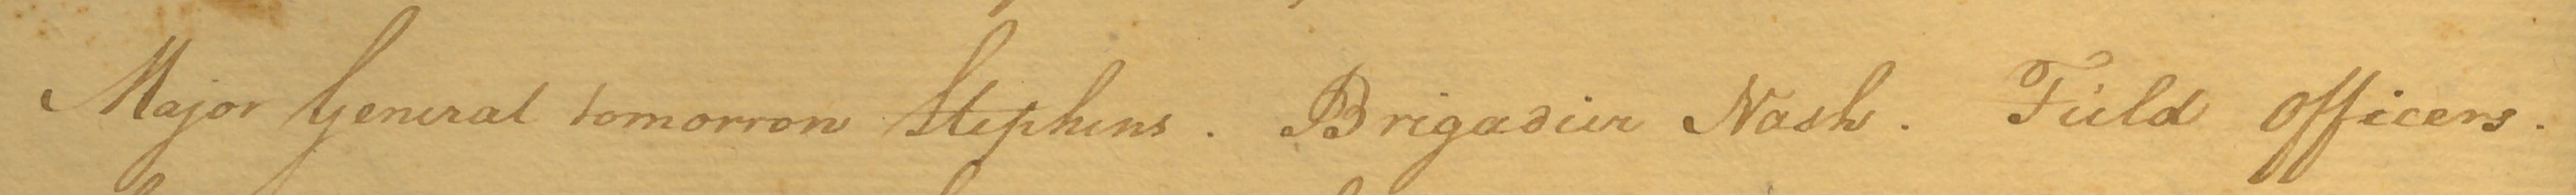Major General tomorrow Stephens. Brigadier Nash. Field Officers.
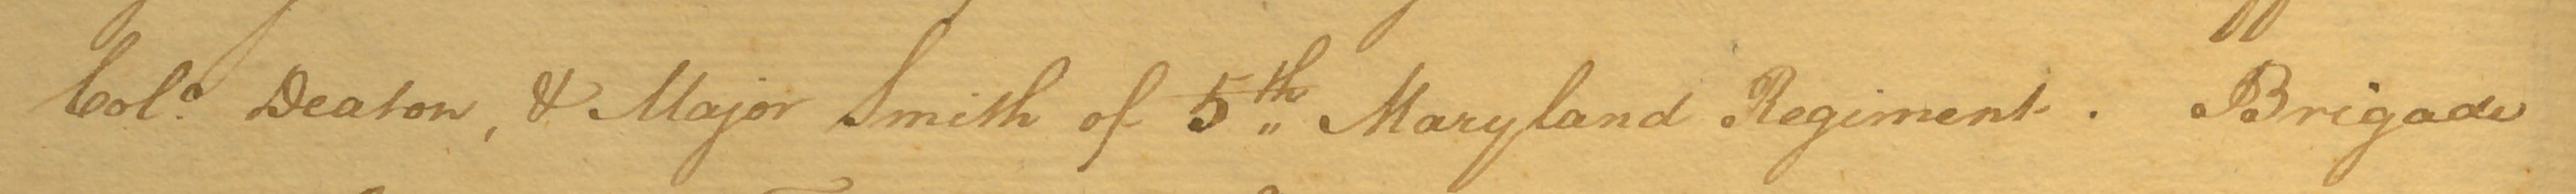Col^o. Deaton, & Major Smith of 5^th. Maryland Regiment. Brigade
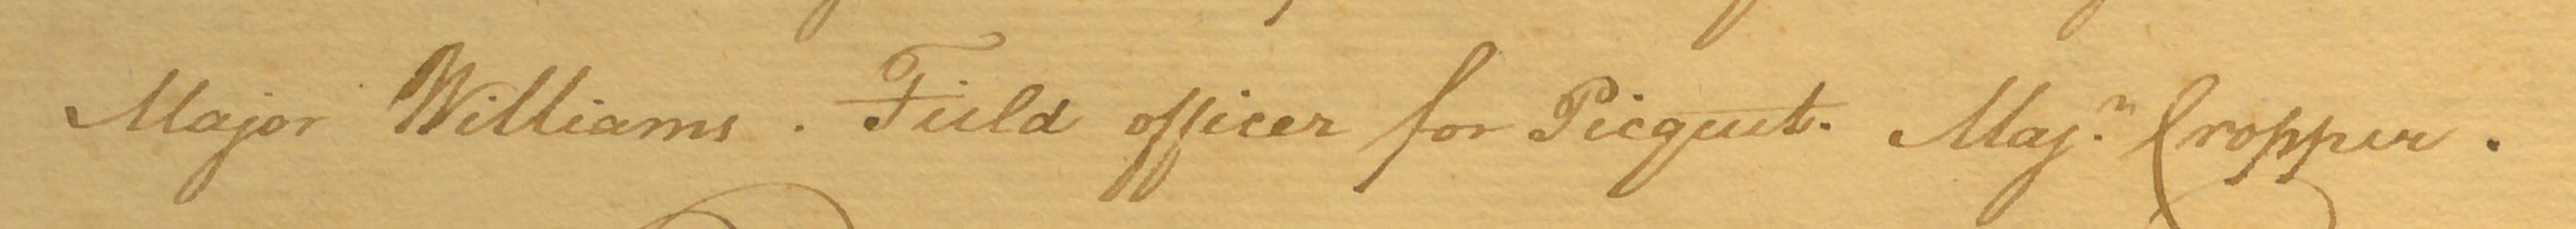Major Williams. Field officer for Picquet. Maj^r. Cropper.
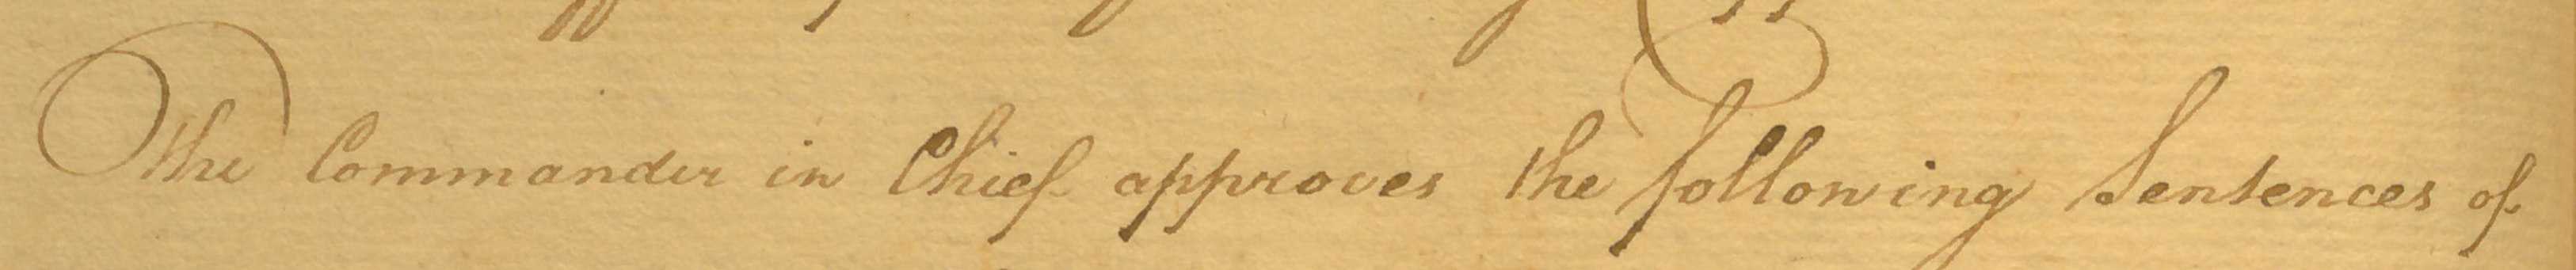the Commander in Chief approves the following Sentences of
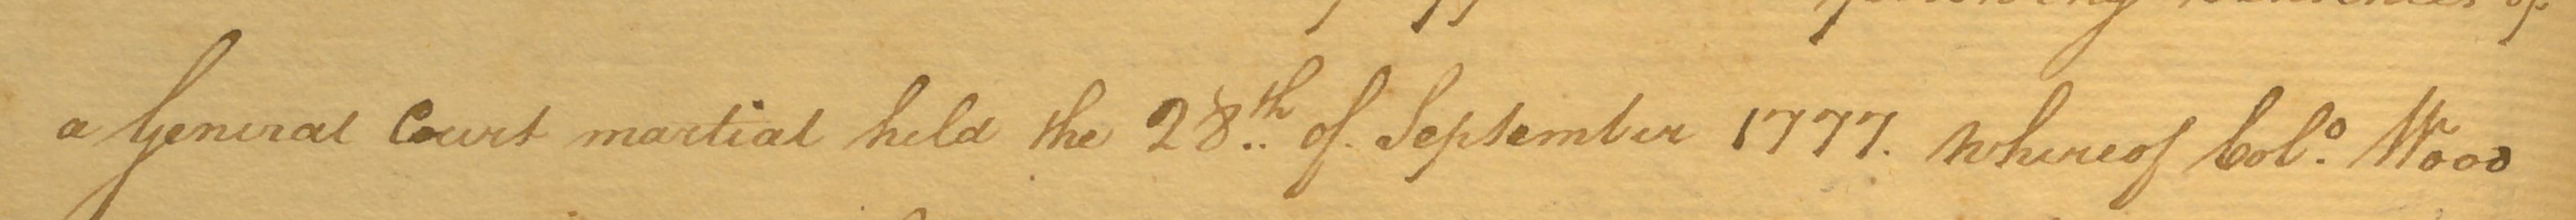a General Court martial held the 28^th. of September 1777. whereof Col^o. Wood
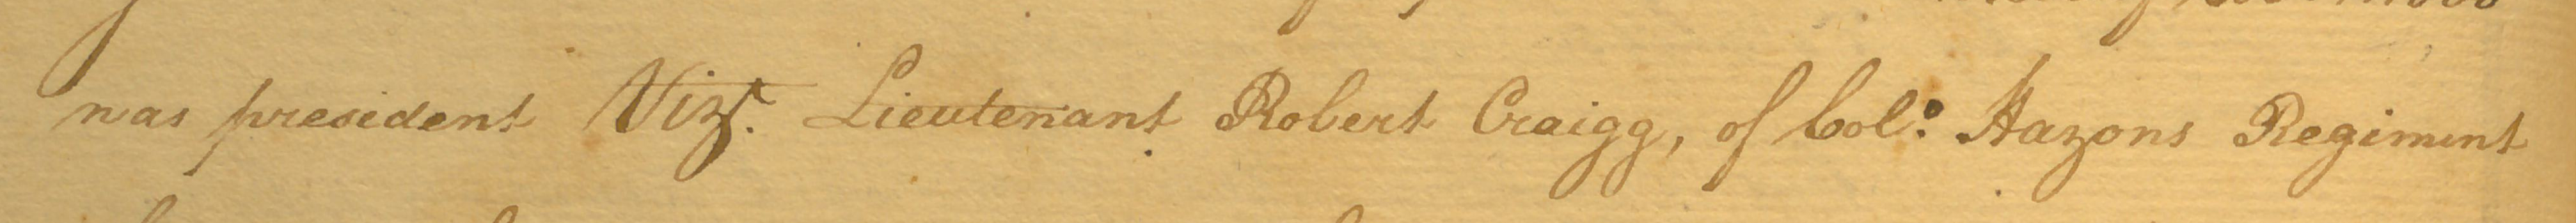was president Viz^t. Lieutenant Robert Craigg, of Col^o. Hazons Regiment
